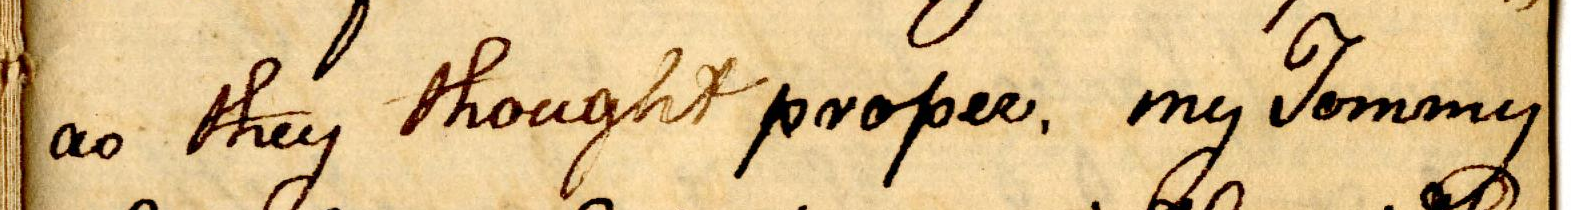as they thought proper, my Tommy
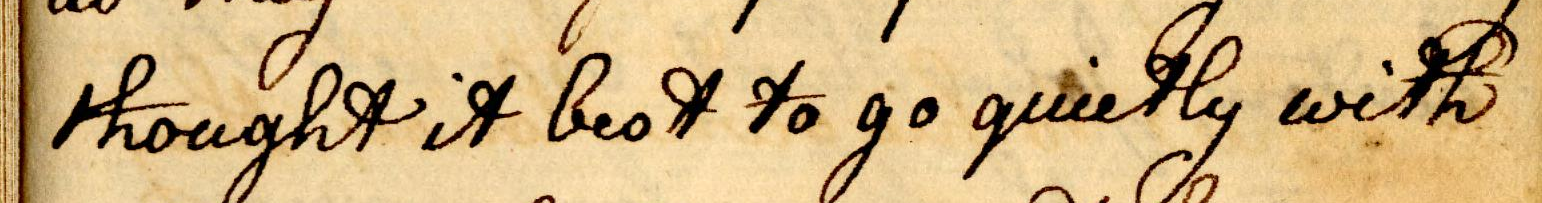though it best to go quietly with
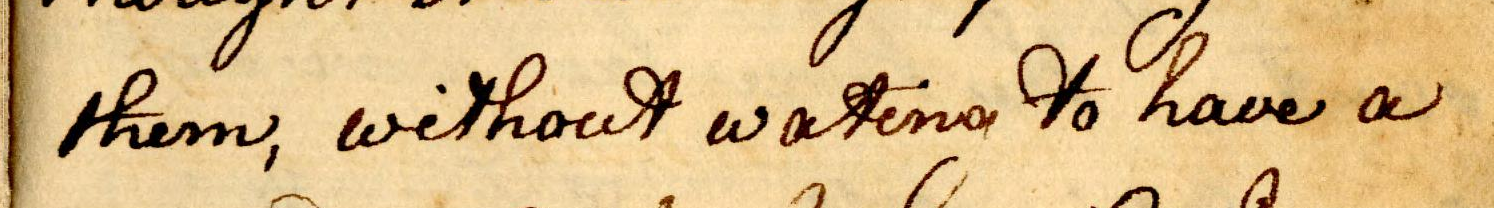them, without wating to have a
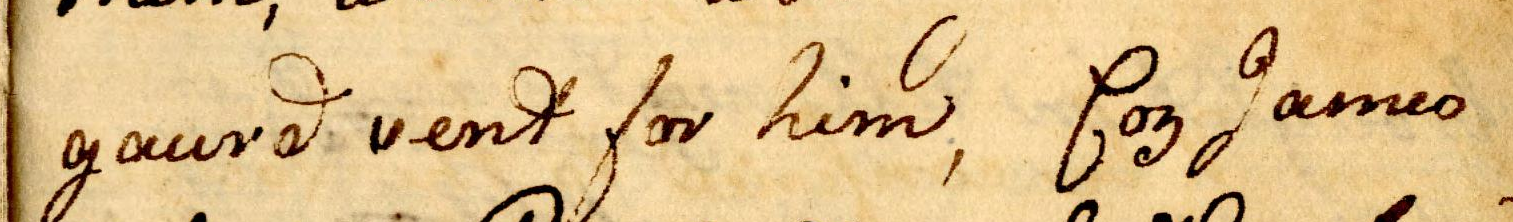gaurd sent for him, Coz James
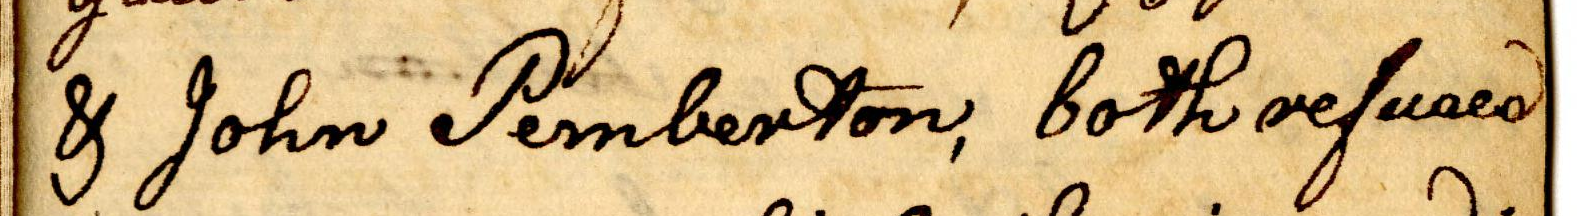& John Pemberton, both refused
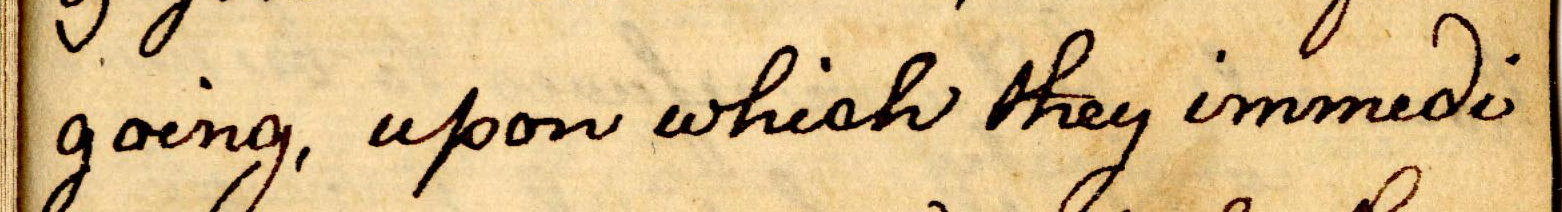going, upon which they immedi
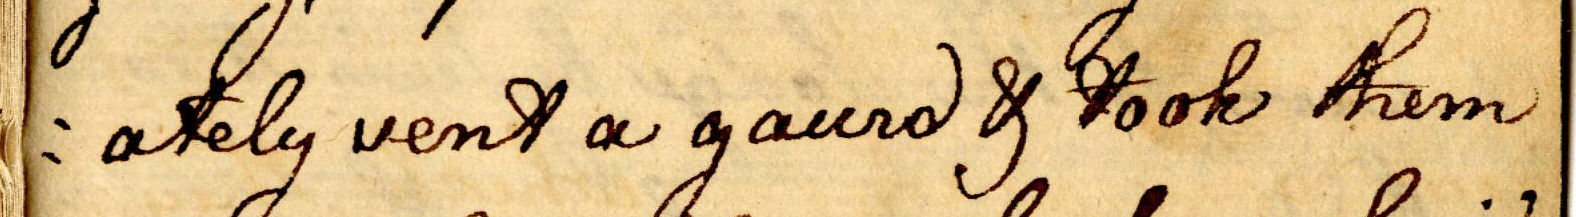-ately sent a gaurd & took them
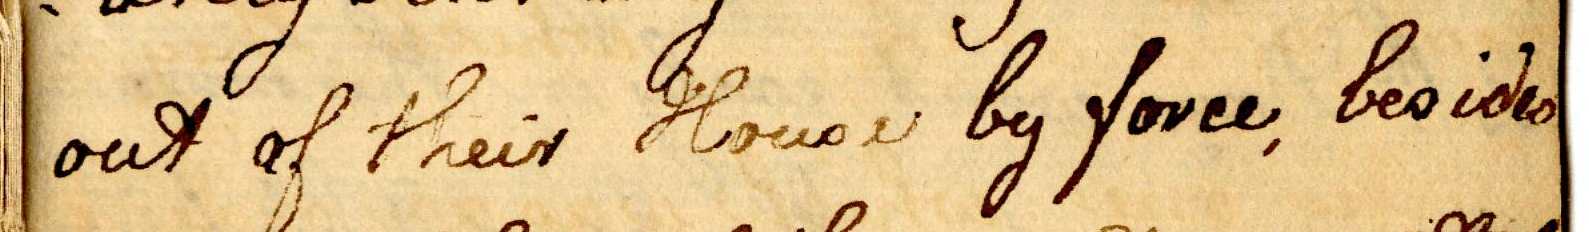out of their House by force, besides
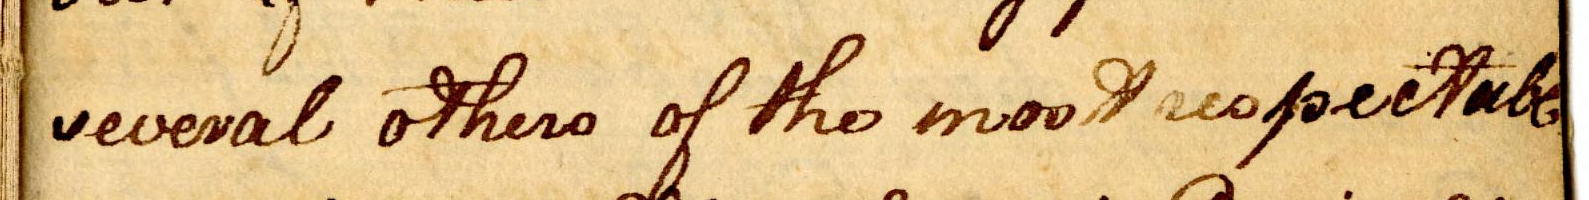several others of the most respectable
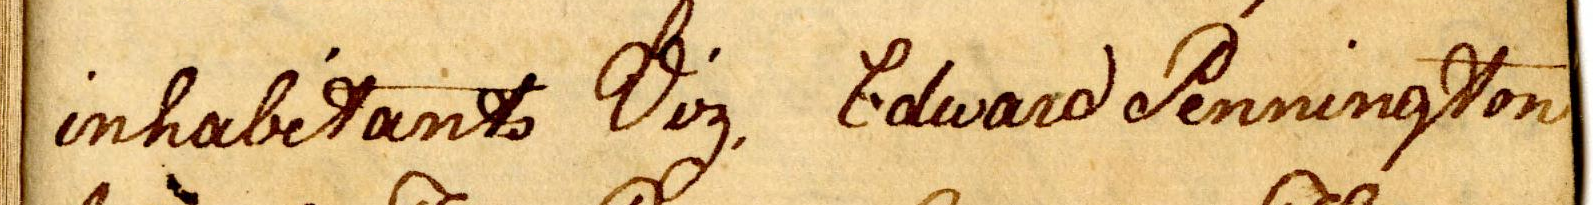inhabitants Viz. Edward Pennington
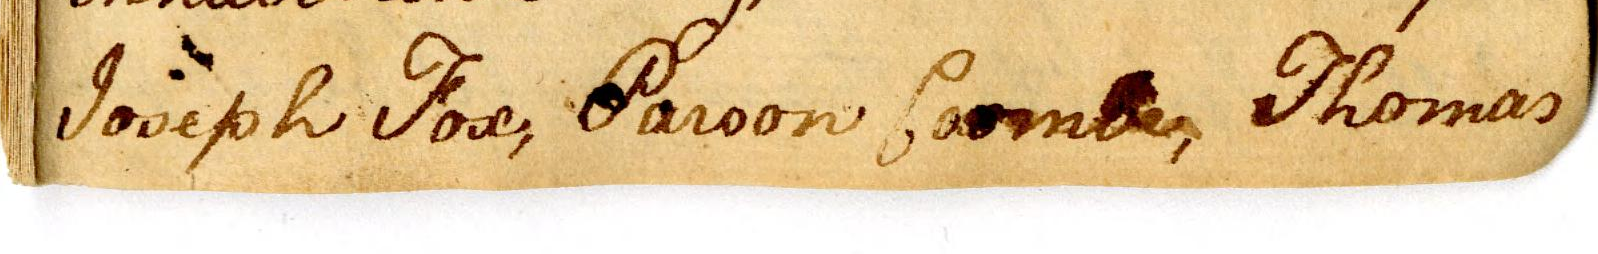Joseph Fox, Parson Coombe, Thomas
